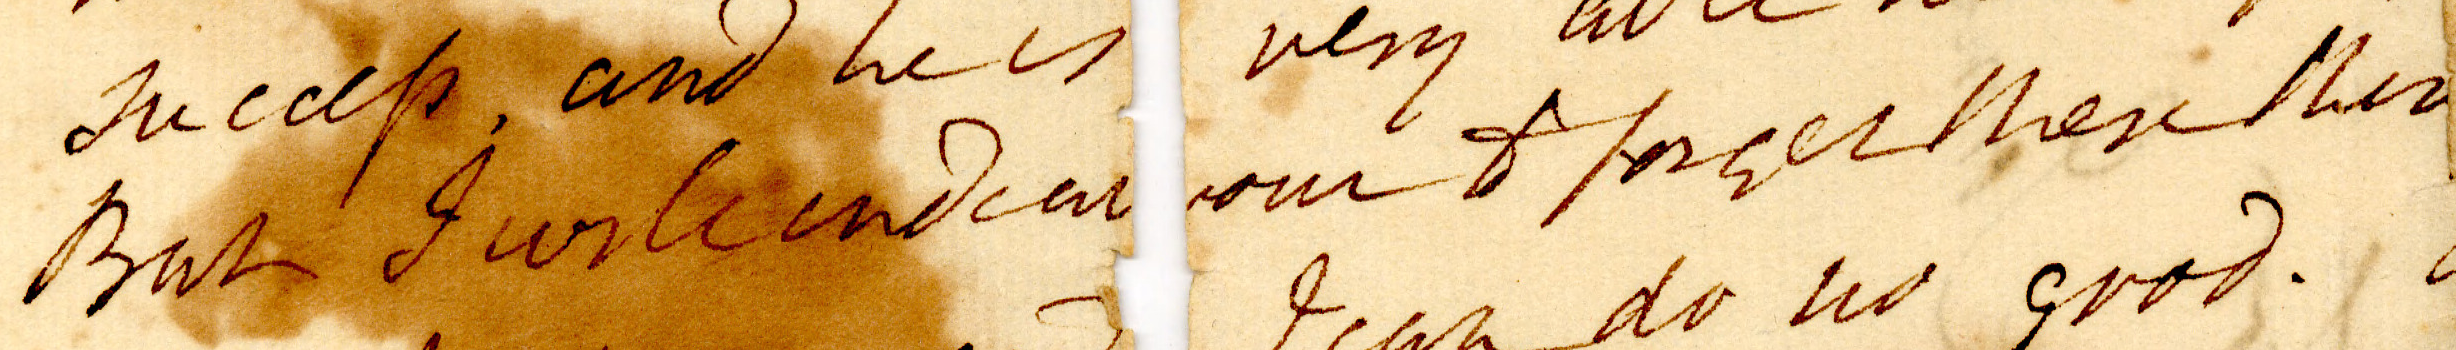But will endeavour t forget these this
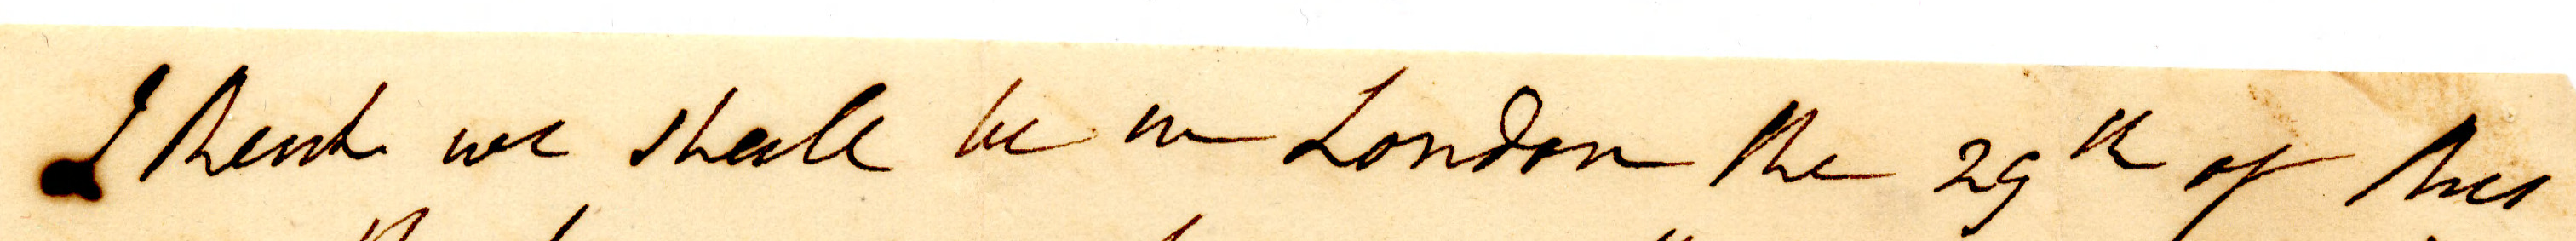I think we shall be in London the 29^th of this
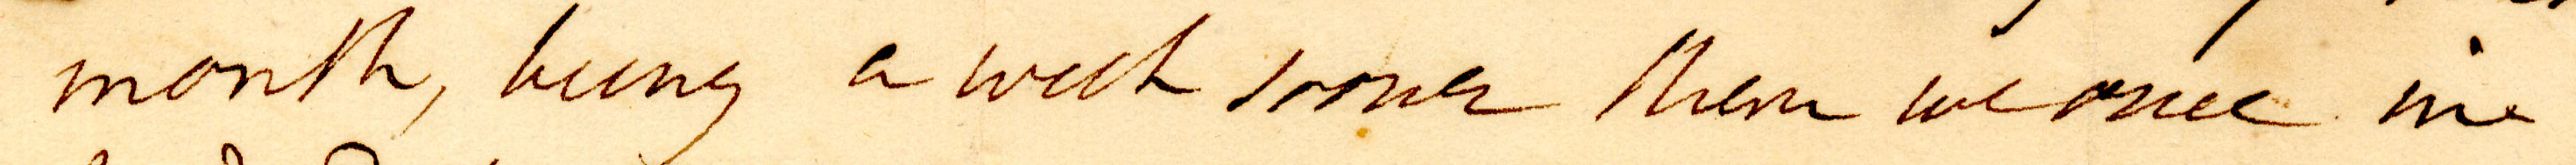month, being a week sooner than we once in
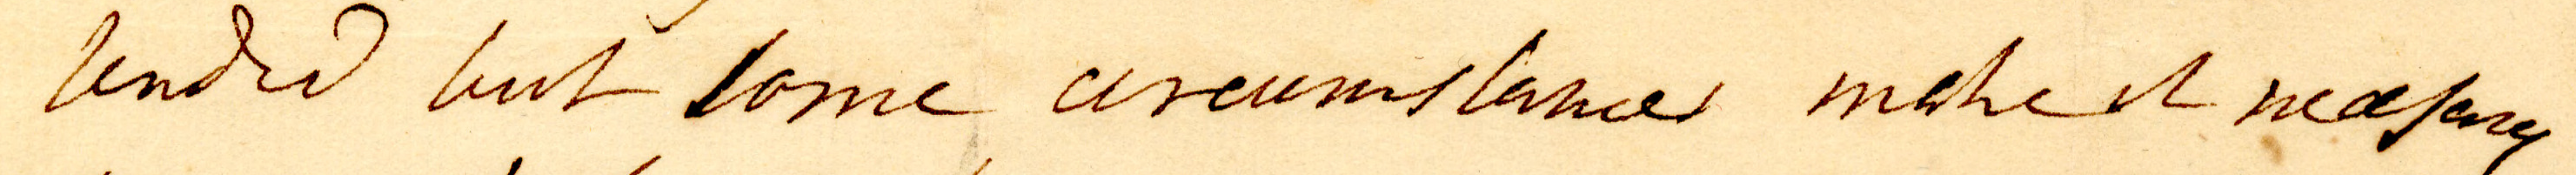tended but some circumstances make it necessary
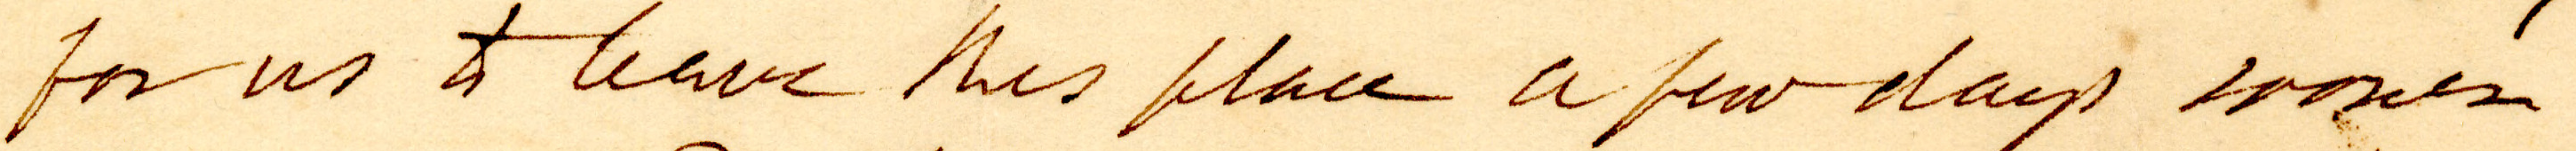for us to leave this place a few days sooner
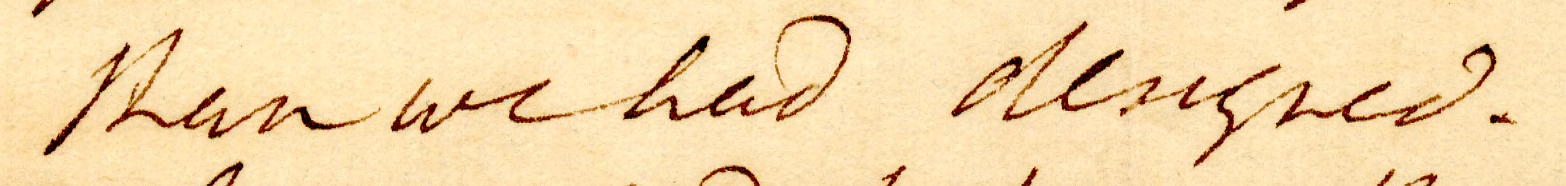than we had designed.
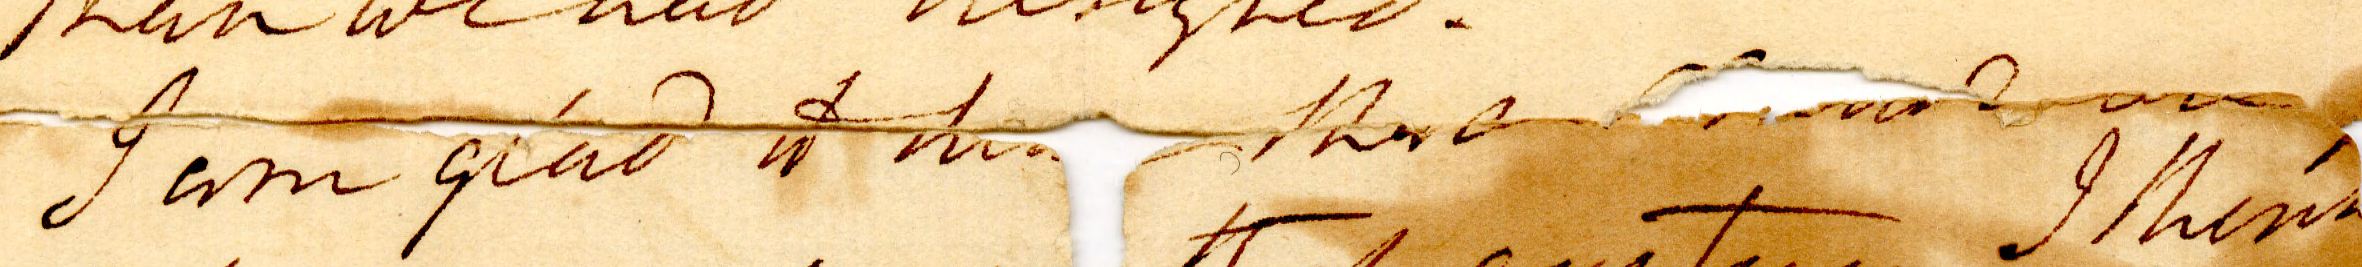I am glad it [_____] that [______]
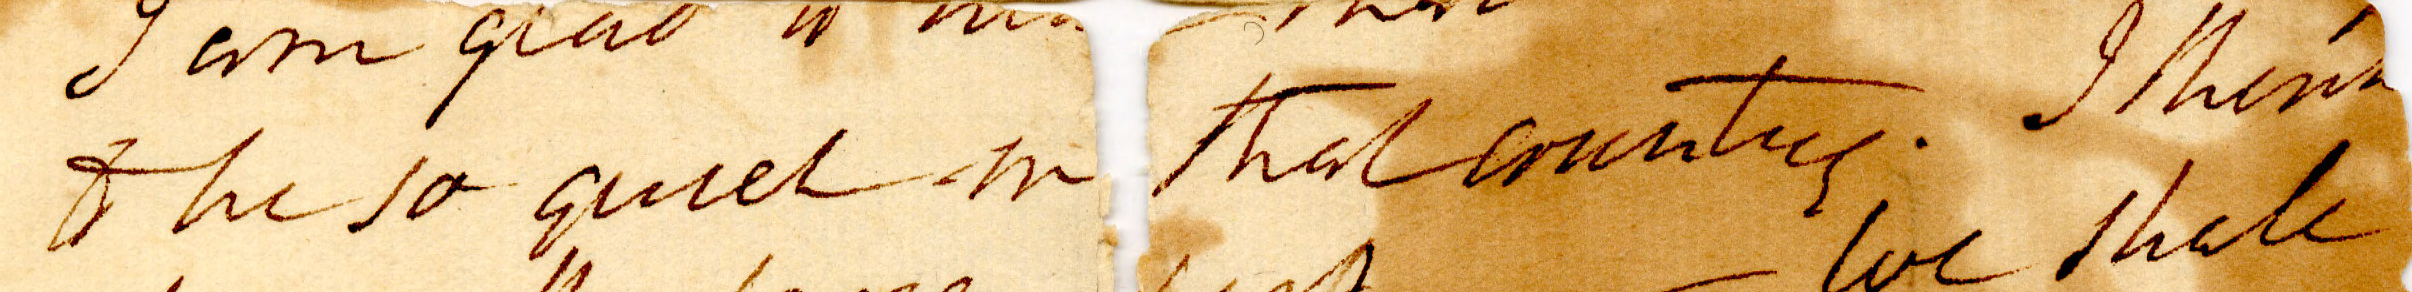& be so quiet in the country. I think
